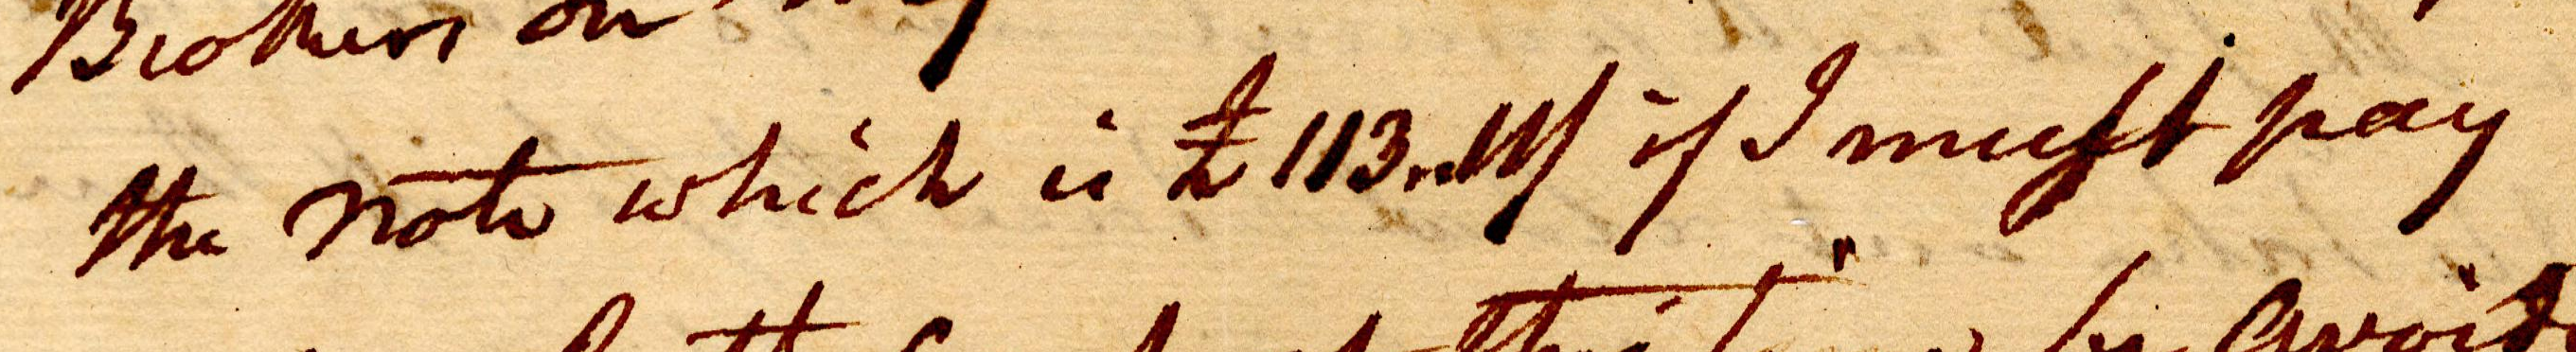the note which is £113.. 11s if I must pay
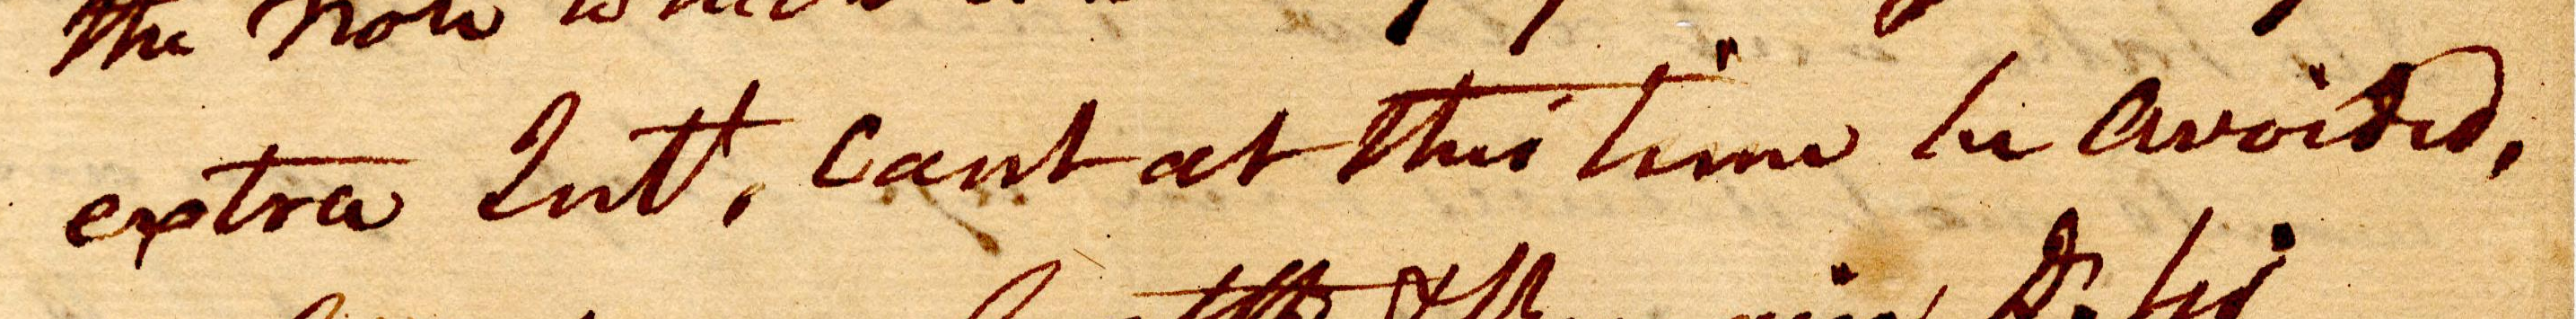extra Int^t, cant at this time be avoided
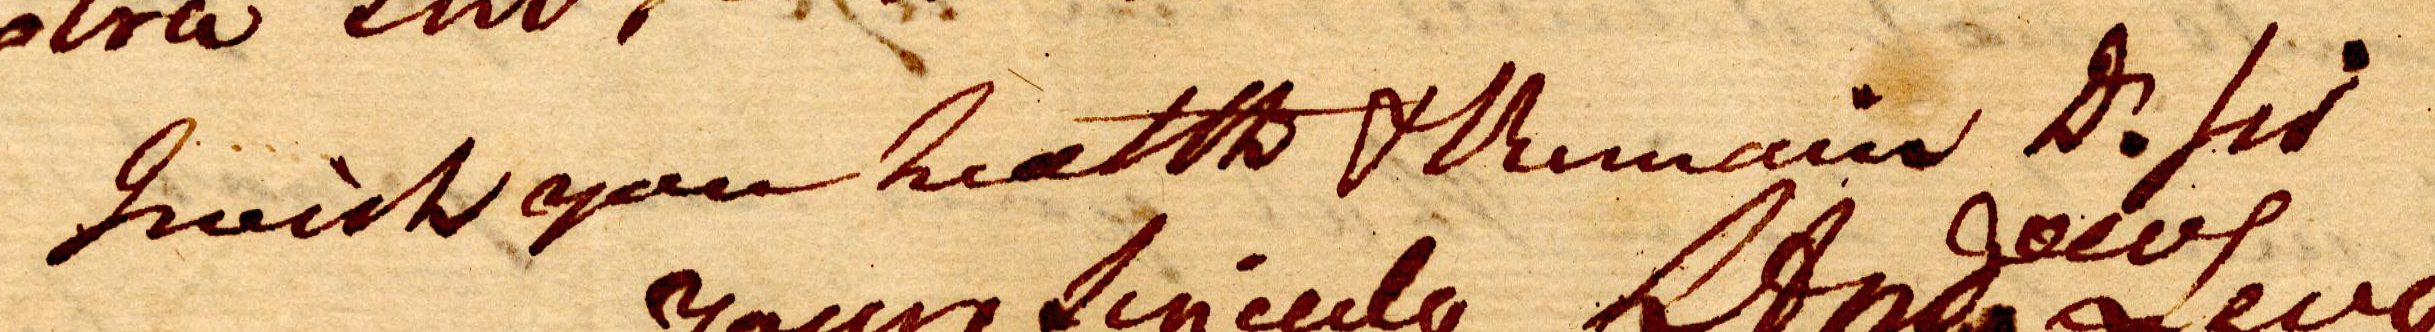I wish you health & Remain D^r. Sir
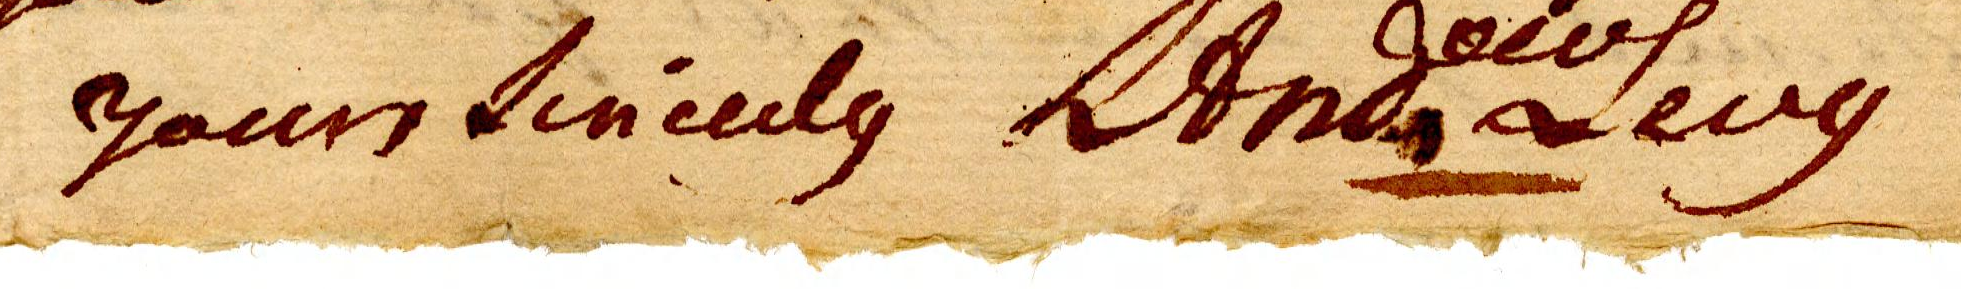yours Sincerely And^rew Levy
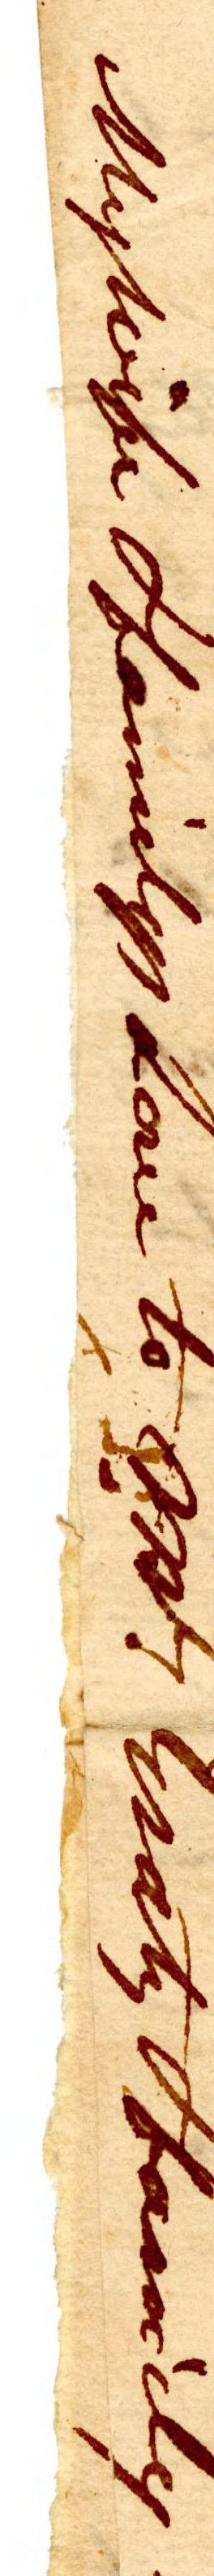My wife & familys Love to M^rs Gratz, & family
